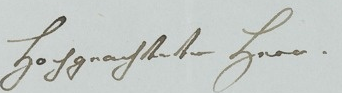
Hochgeachteter Herr.
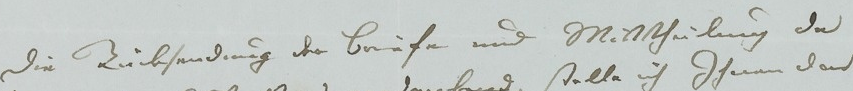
Die Rücksendung der Briefe und Mittheilung des
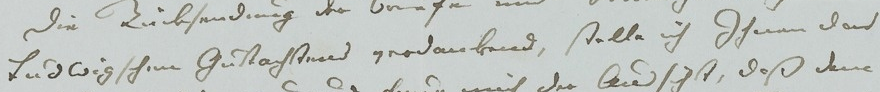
Ludwigschen Gutachtens verdankend, stelle ich Ihnen das
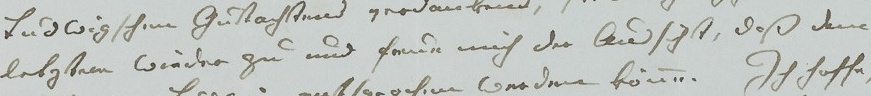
letztere wieder zu und freue mich der Aussicht, daß dem
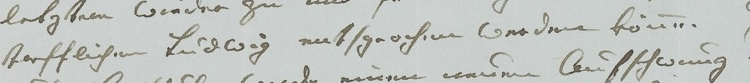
trefflichen Ludwig entsprochen werden könne.
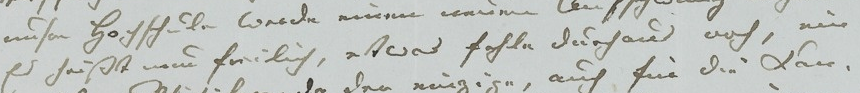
Es heißt nun freilich, etwas fehle durchaus noch, ein
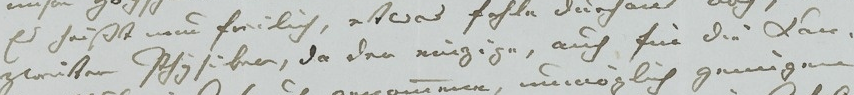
zweiter Physiker, da der einzige, auch für die Kan-
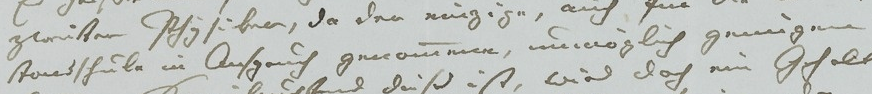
tonsschule in Anspruch genommen, unmöglich genügen
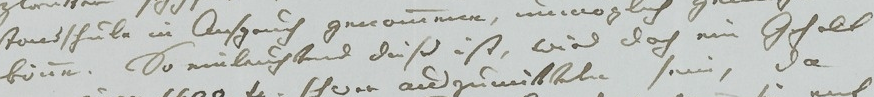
könne. So einleuchtend dieß ist, wird doch ein Gehalt
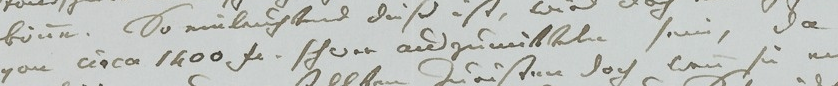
von circa 1400 Fr. schwer auszumitteln sein, da
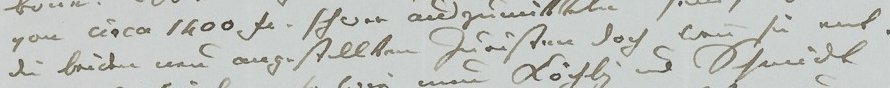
die beiden neu angestellten Juristen doch wenn sie ent-
